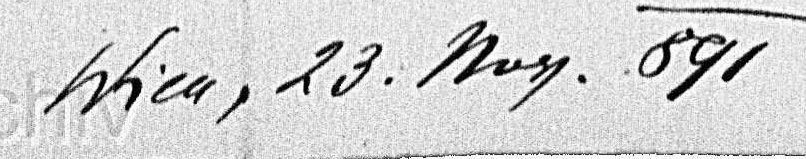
Wien, 23 Nov. 1891
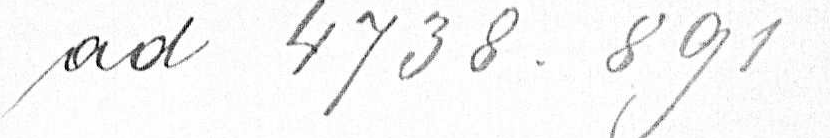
ad 4738 1891
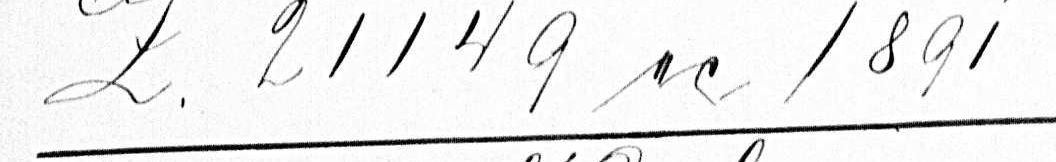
Z. 21149 ec 1891/
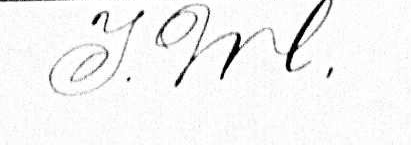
J.M.
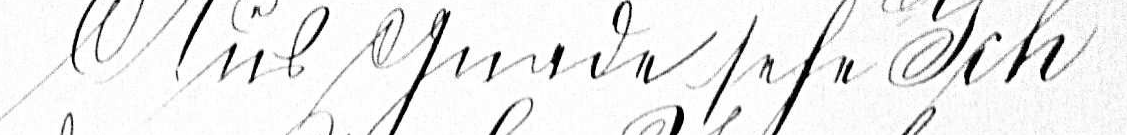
Aus Gnade sehe Ich
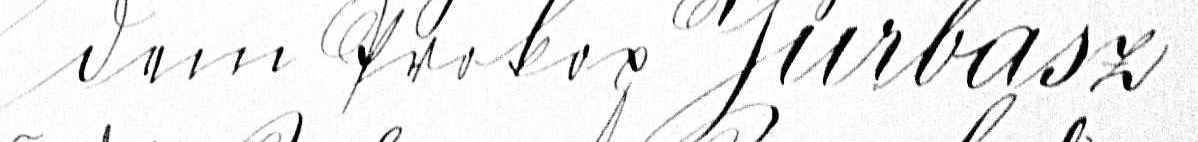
dem Prokop Jurbasz
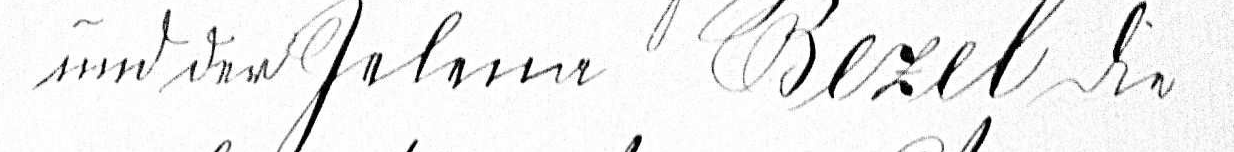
und der Jelena Bezel die
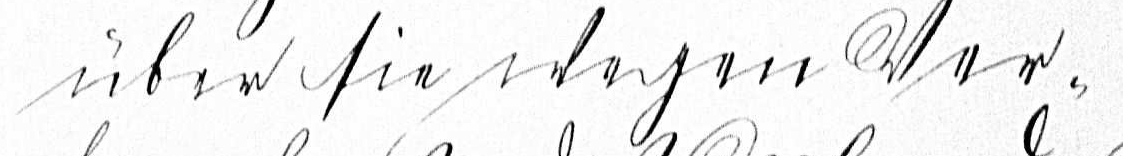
über sie wegen Ver¬
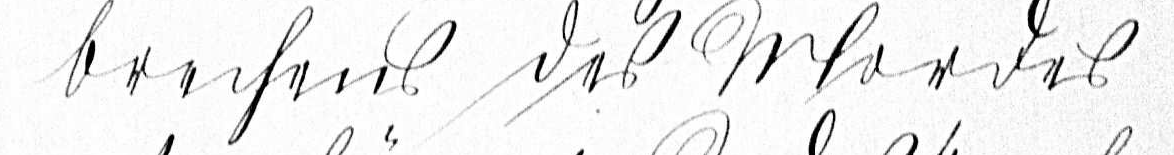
brechens des Mordes
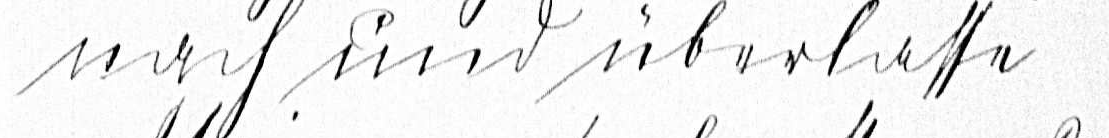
nach und überlasse
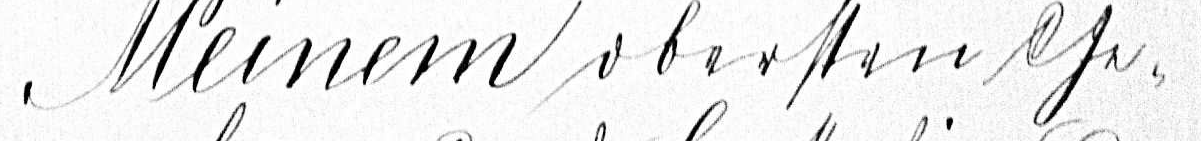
Meinem Obersten Ge¬
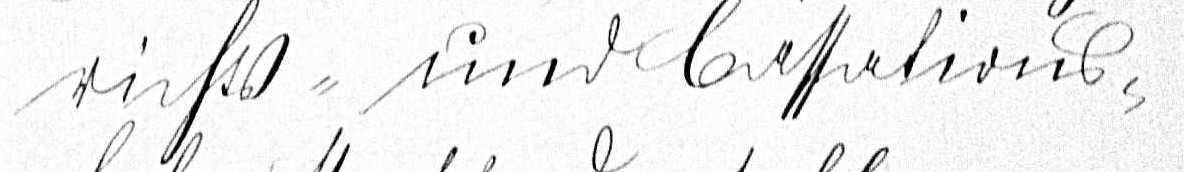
richts- und Cassations¬
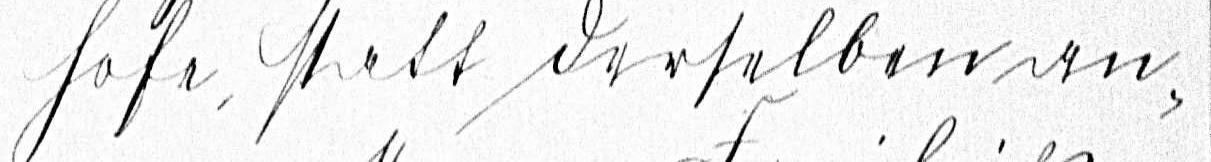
hofe, statt derselben an¬
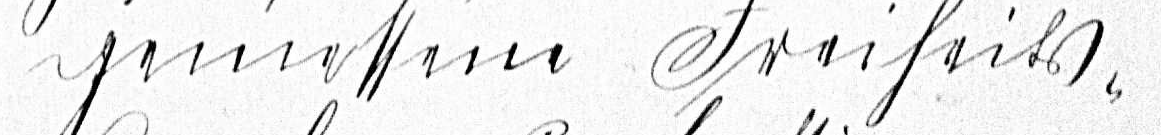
gemessene Freiheits¬
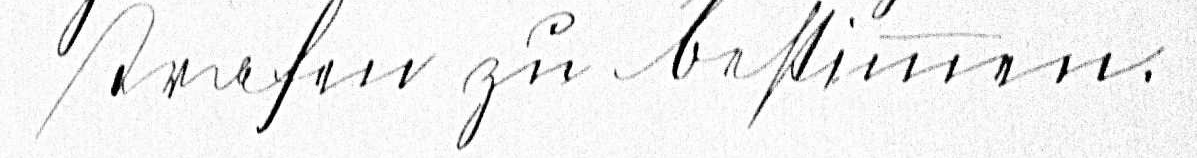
strafen zu bestimmen.
